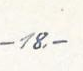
18
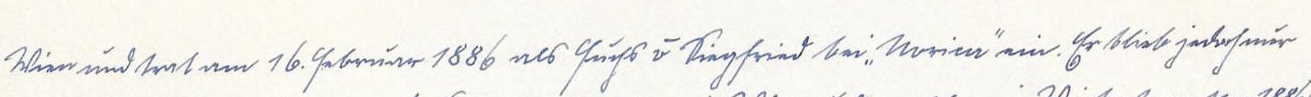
Wien und trat dort am 16. Februar 1886 als Fuchs v/o Siegfried bei „Norica“ ein. Er blieb jedoch nur
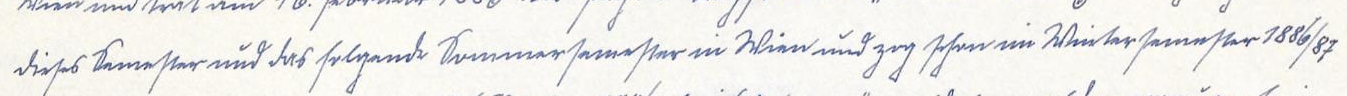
dieses Semester und das folgende Sommersemester in Wien und zog schon im Wintersemester 1886/87
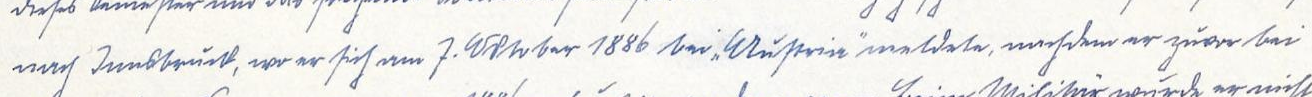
nach Innsbruck, wo er sich am 7. Oktober 1886 bei „Austria“ meldete, nachdem er zuvor bei
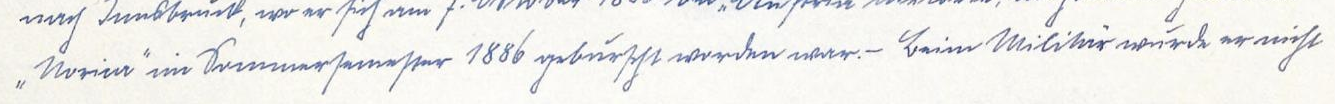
„Norica“ im Sommersemester 1886 geburscht worden war. Beim Militär wurde er nicht
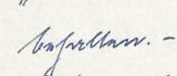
behalten.
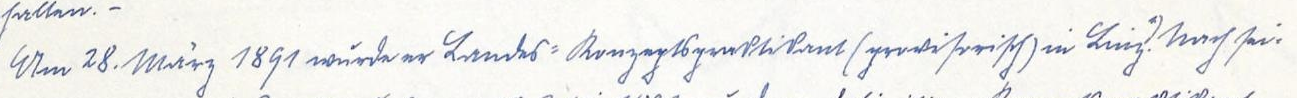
Am 28. März 1891 wurde er Landes- Konzeptspraktikant (provisorisch) in Linz 1). Nach sei-
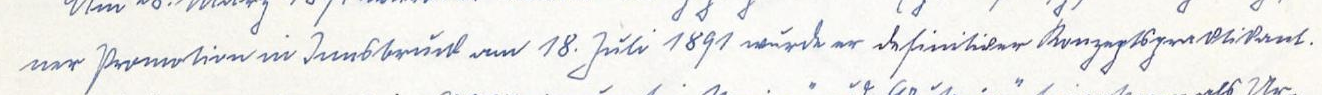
ner Promotion in Innsbruck am 18. Juli 1891 wurde er definitiver Konzeptspraktikant.
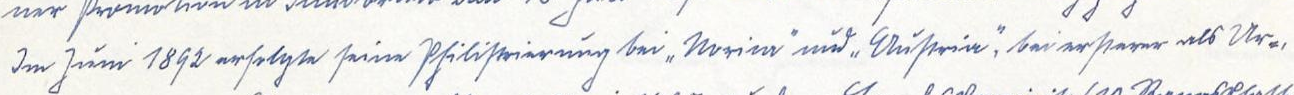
Im Juni 1892 erfolgte seine Philistrierung bei „Norica“ und „Austria“, bei ersterer als Ur-,
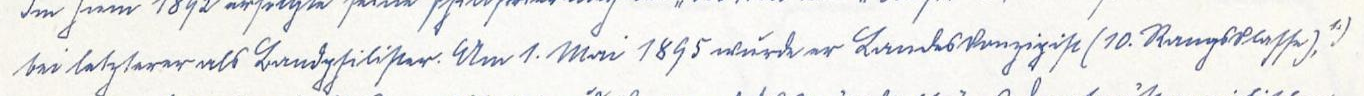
bei letzterer als Bandphilister. Am 1. Mai 1885 wurde er Landeskonzipist (10. Rangsklasse), 1)
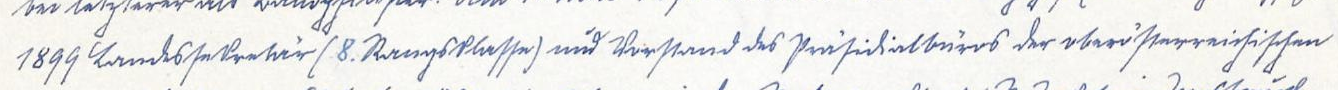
1899 Landessekretär (8. Rangsklasse) und Vorstand des Präsidialbüros der oberösterreichischen
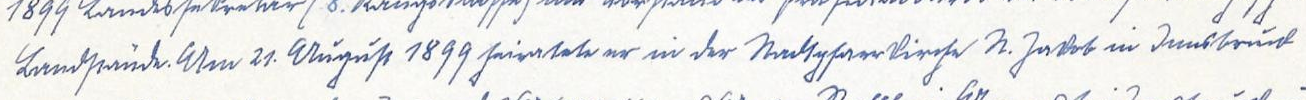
Landstände. Am 21. August 1899 heiratete er in der Stadtpfarrkirche St. Jakob in Innsbruck
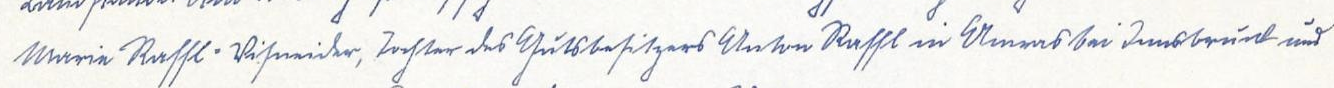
Maria Raffl - Visneider, Tochter des Gutsbesitzers Anton Raffl in Amras bei Innsbruck und
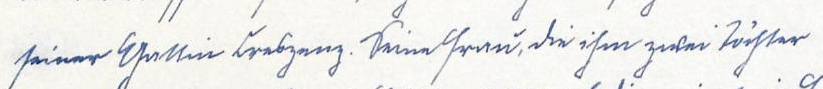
seiner Gattin Creszenz. Seine Frau, die ihm zwei Töchter
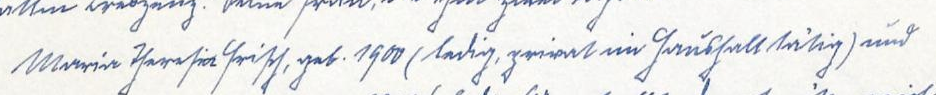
Maria Theresia Frisch, geboren 1900 (ledig, privat im Haushalt tätig) und
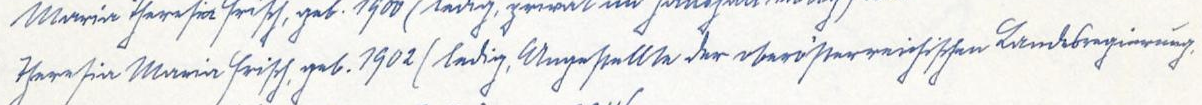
Theresia Maria Frisch, geboren 1902 (ledig, Angestellte der oberösterreichischen Landesregierung
